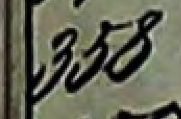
358
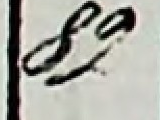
82
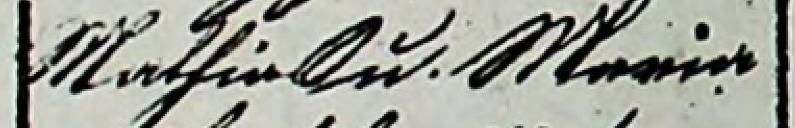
Mathias u. Maria
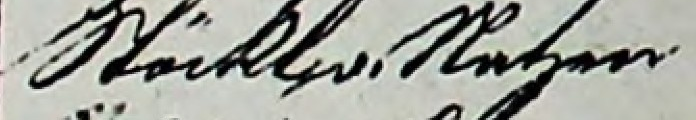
Stöckl v. Natzen
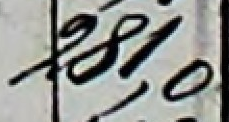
281,0
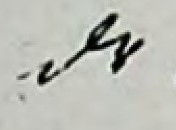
do
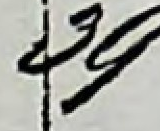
39
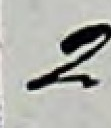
2
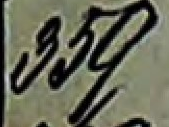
359
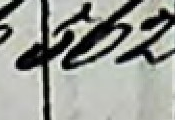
562
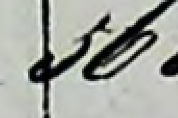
56
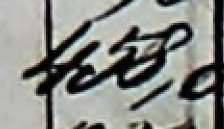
458,0
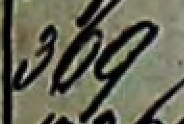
369
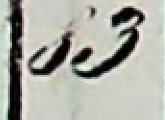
83
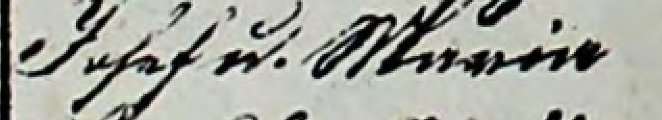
Josef u. Maria
